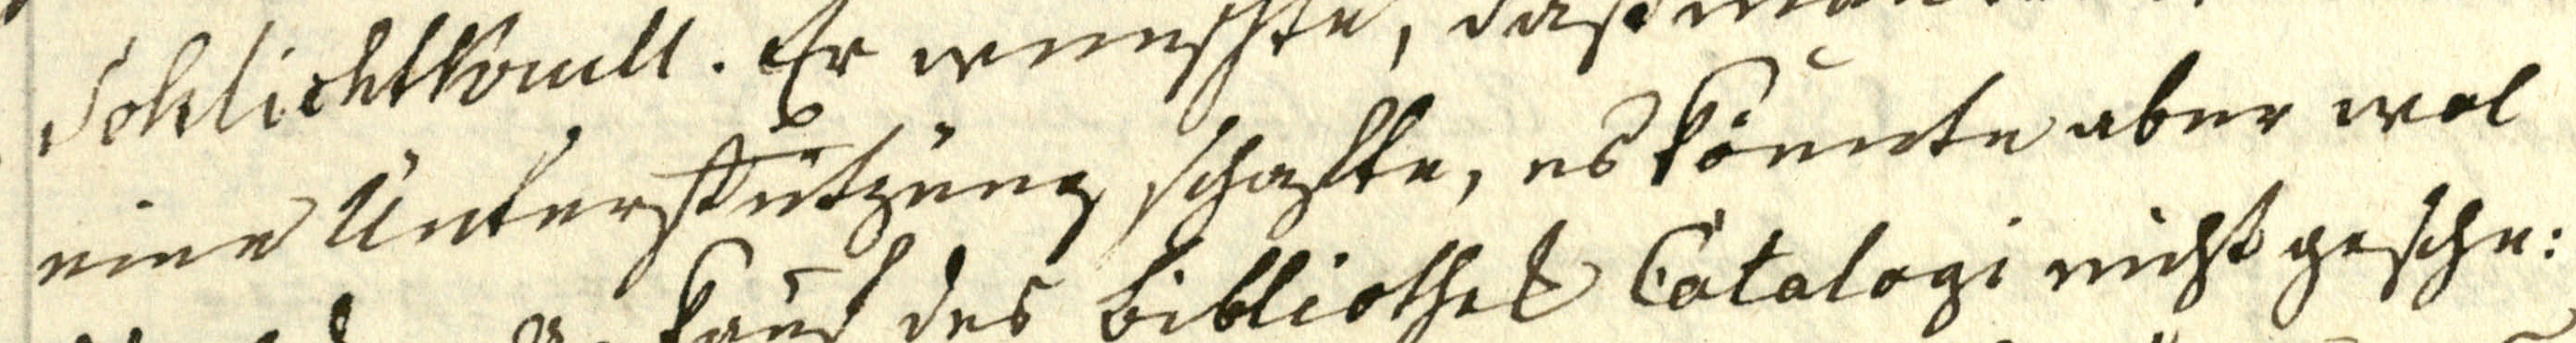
eine Unterstützung schafte, es könnte aber wol
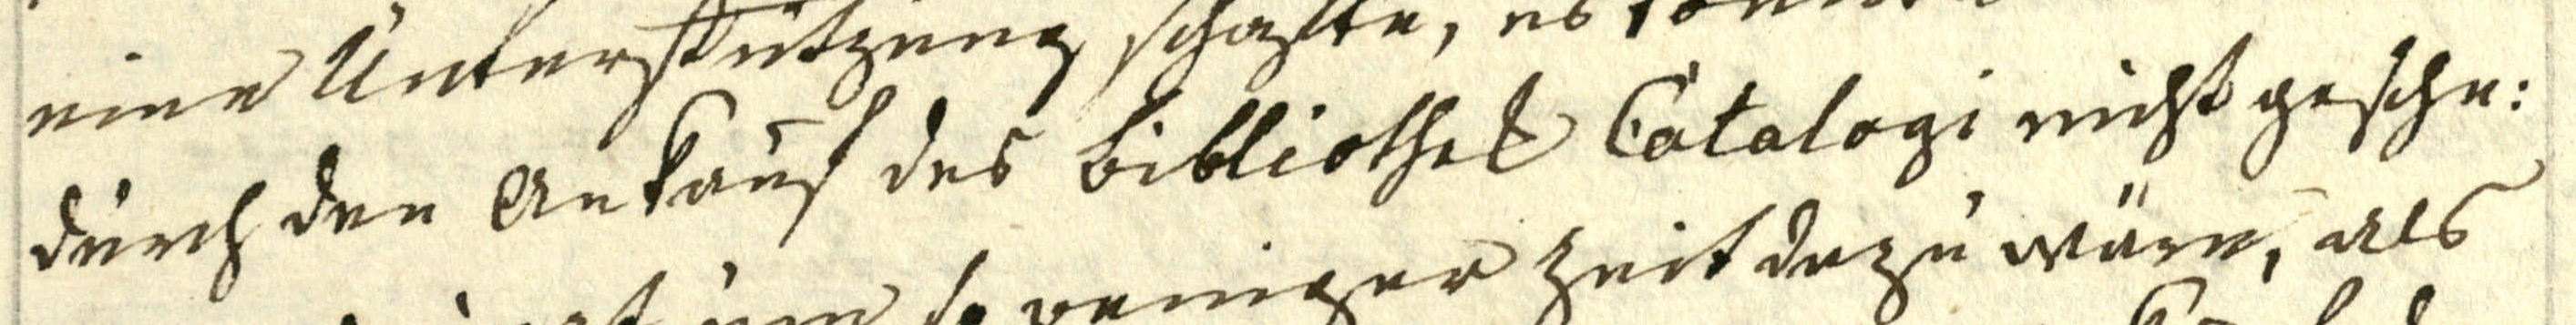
durch den Ankauf des Bibliothek Catalogi nicht gesche¬
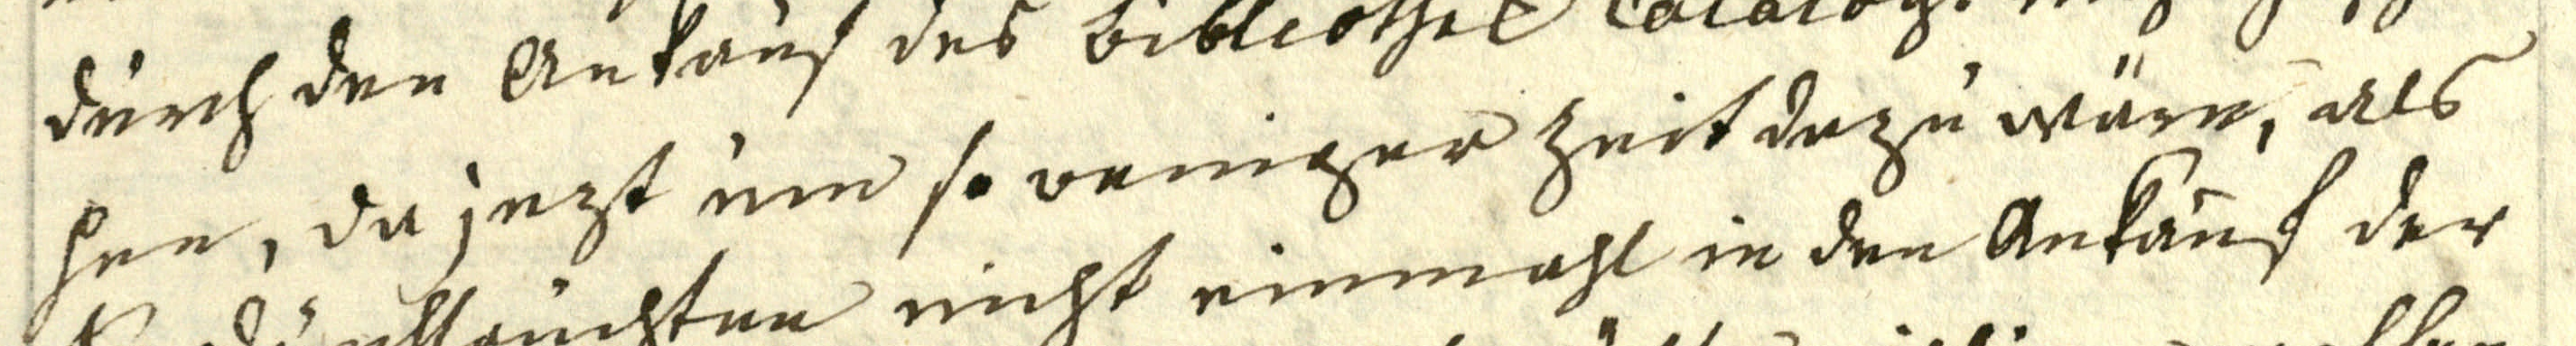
hen, da jezt um so weniger Zeit dazu wäre, als
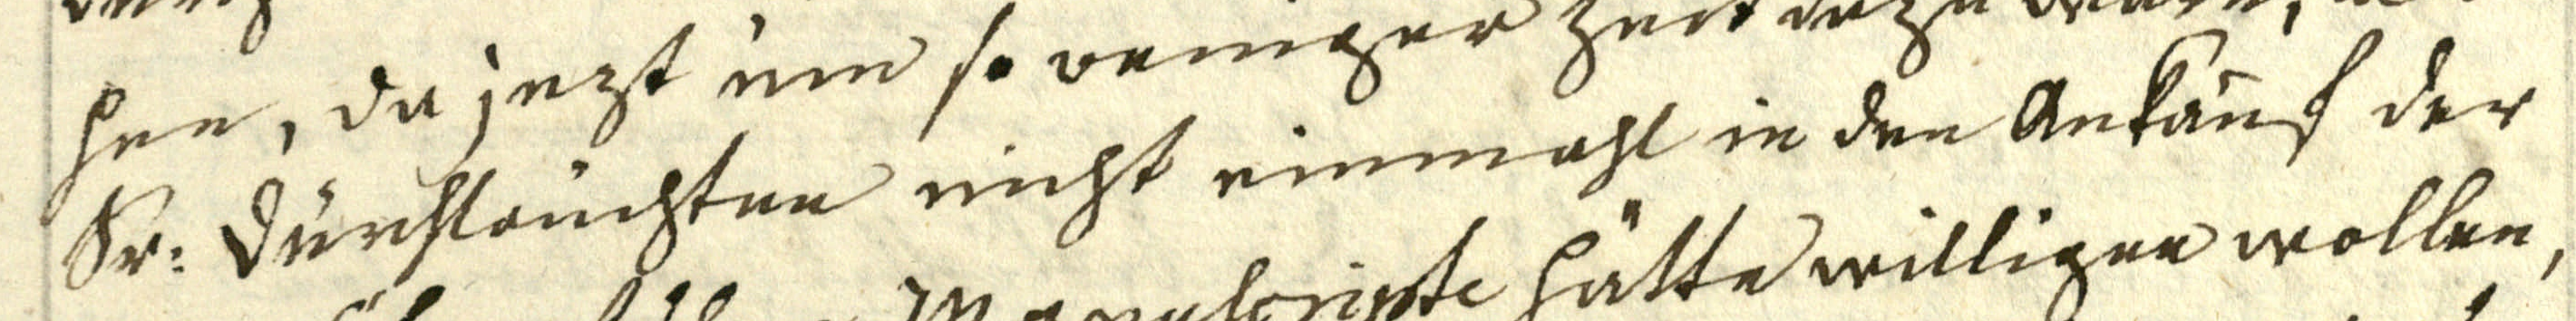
Sr. Durchlauchten nicht einmahl in den Ankauf der
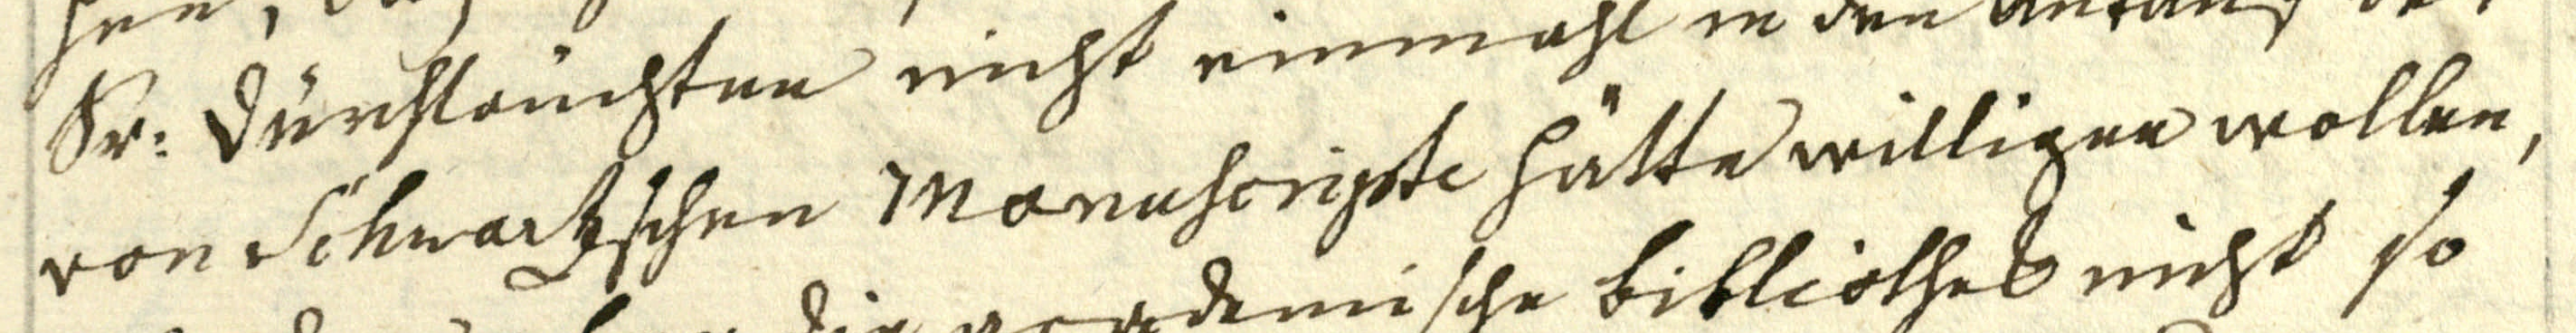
von Schwartzschen Manuscripte hätte willigen wollen,
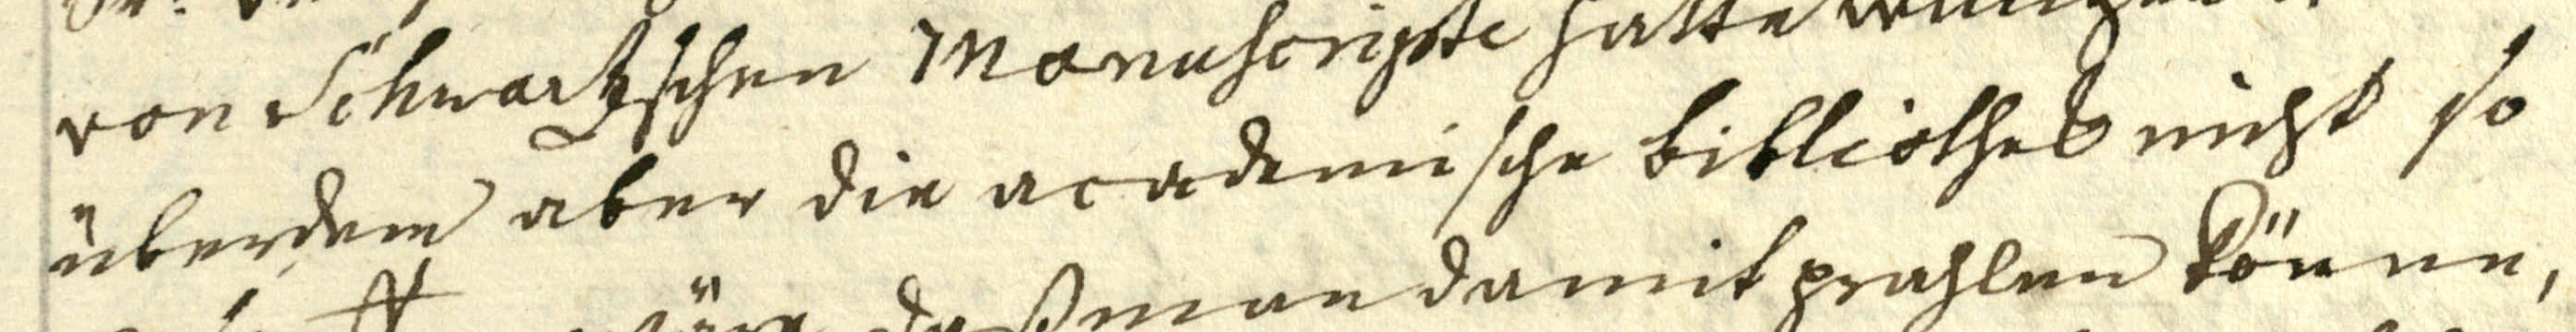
überdem aber die academische Bibliothek nicht so
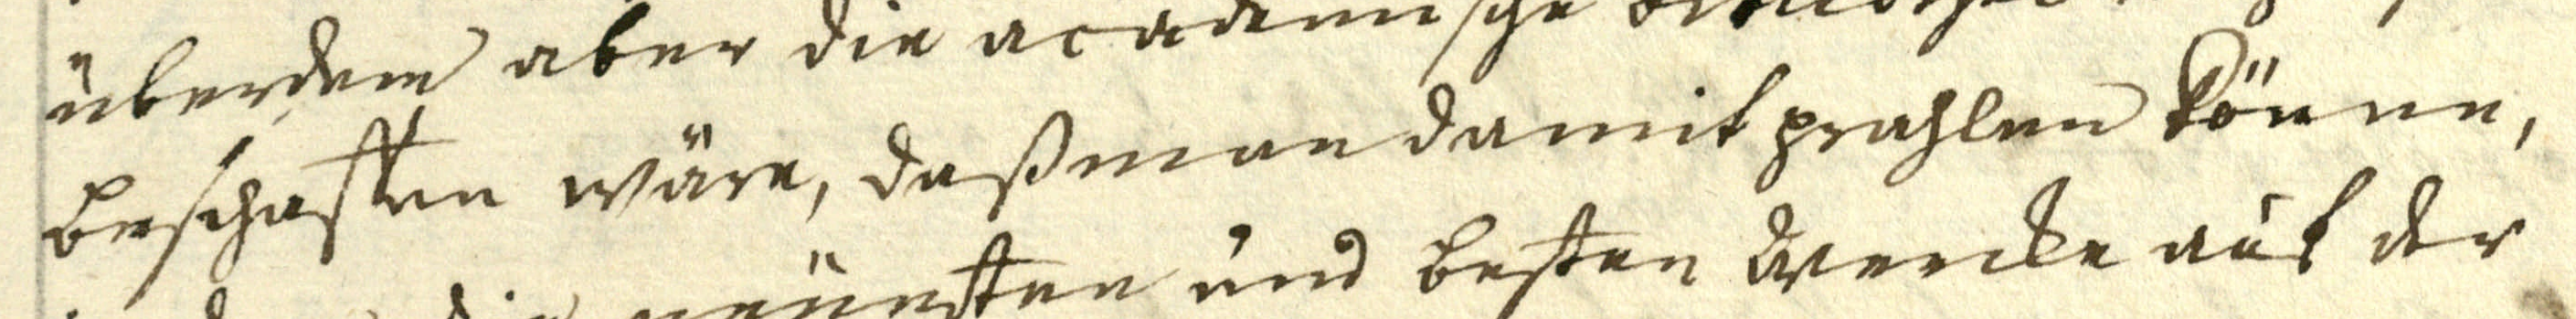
beschaffen wäre, daß man damit prahlen könne,
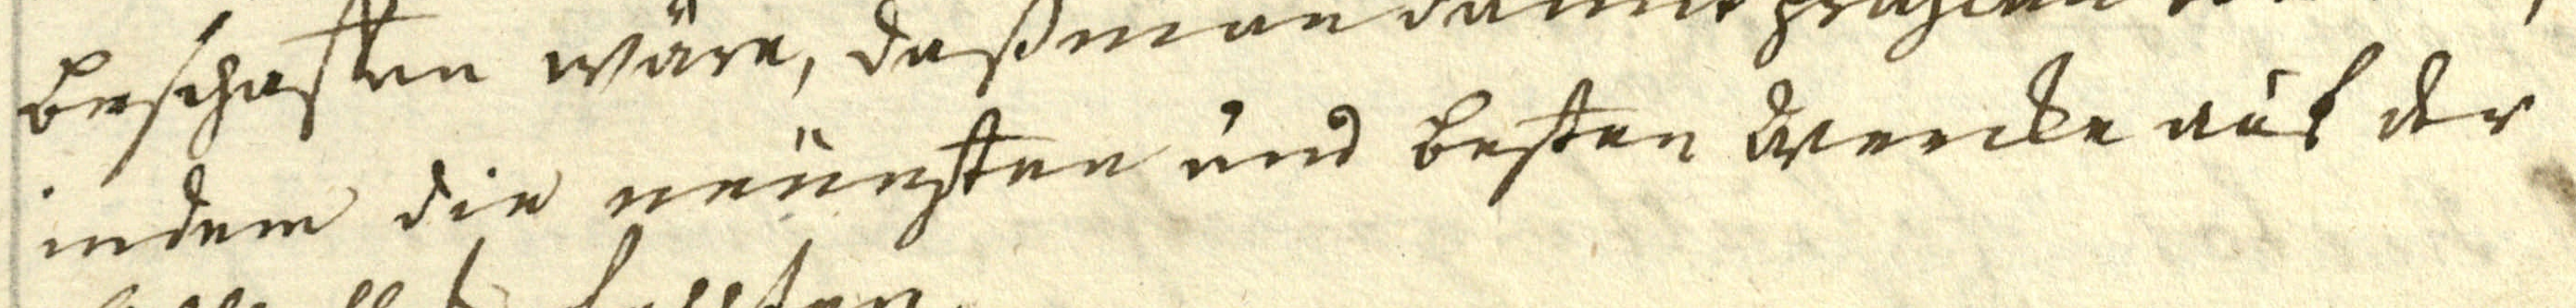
indem die neuesten und besten Wercke auf der
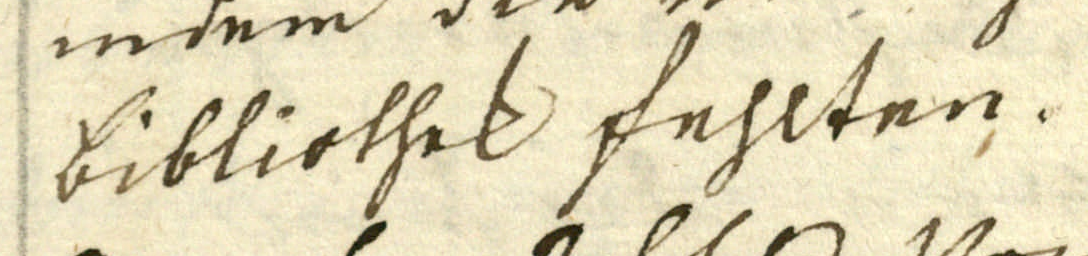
Bibliothek fehlten.
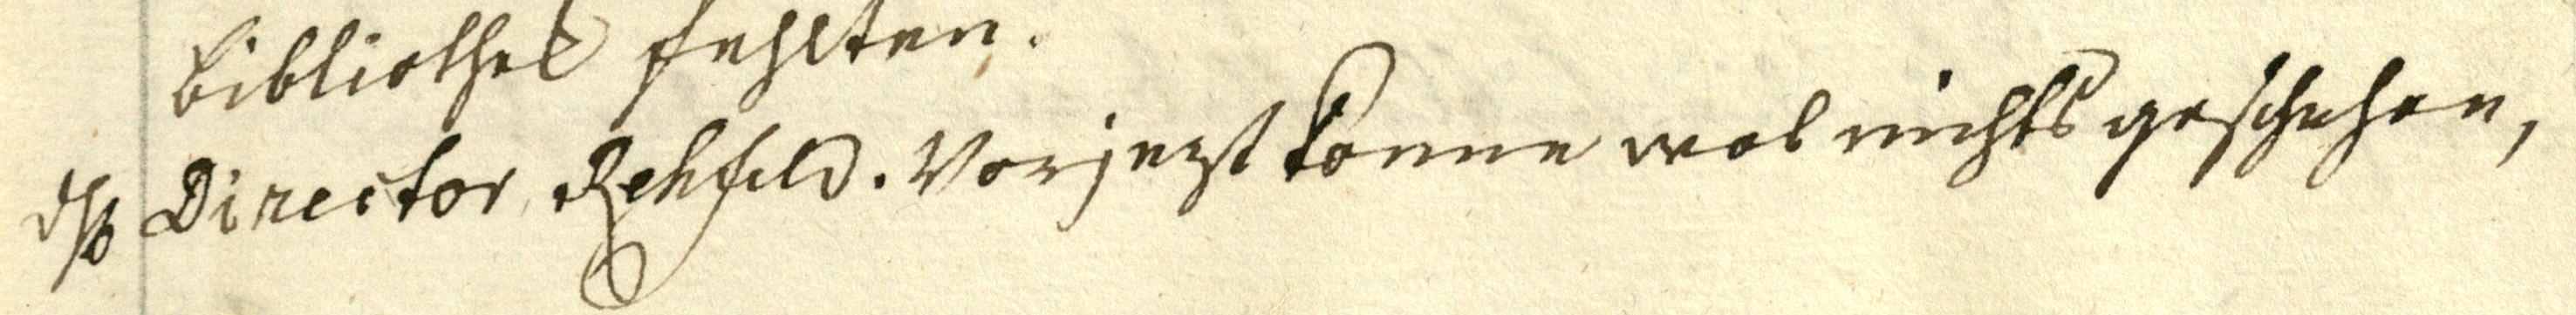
dh Director Rehfeld. Vorjezt könne wol nichts geschehen,
